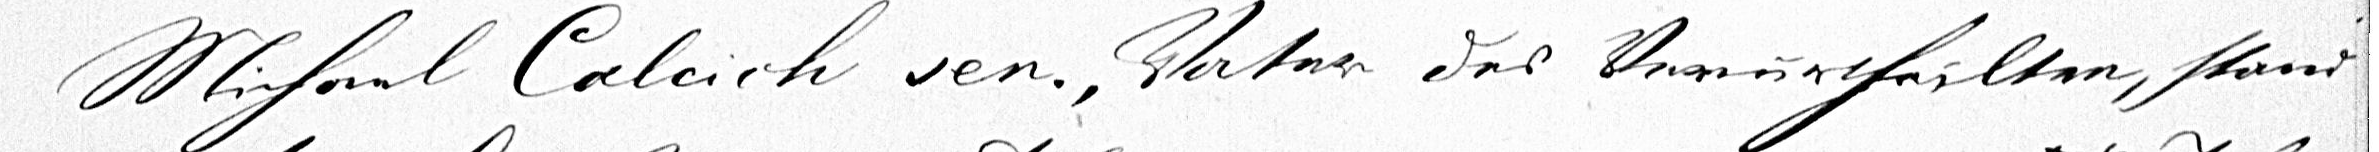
Michael Calcich sen., Vater des Verurtheilten, stand
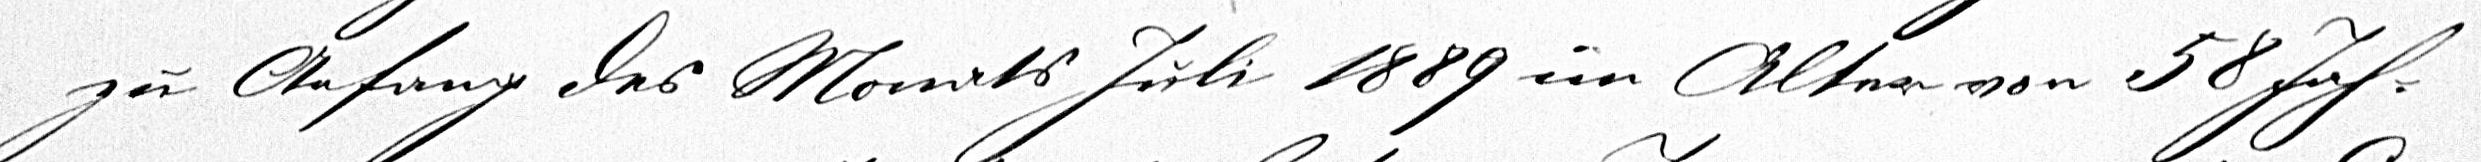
zu Anfang des Monats Juli 1889 im Alter von 58 Jah¬
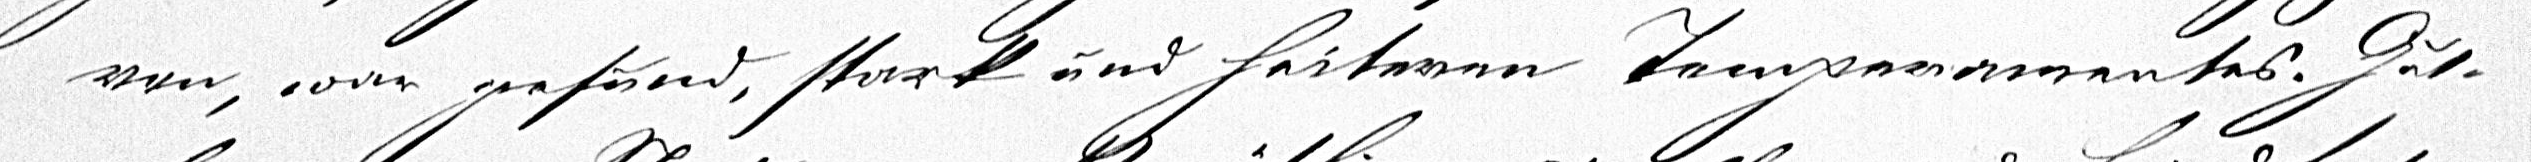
ren, war gesund, stark und heiteren Temperamentes. Gut¬
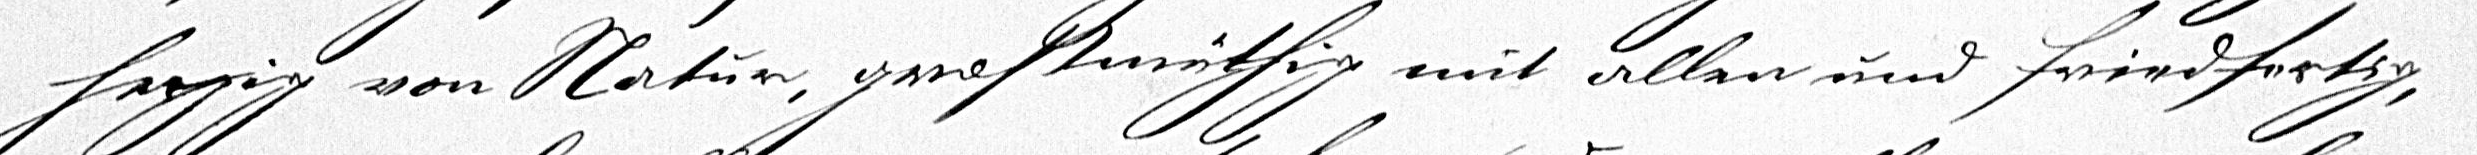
herzig von Natur, großmüthig mit allen und friedfertig,
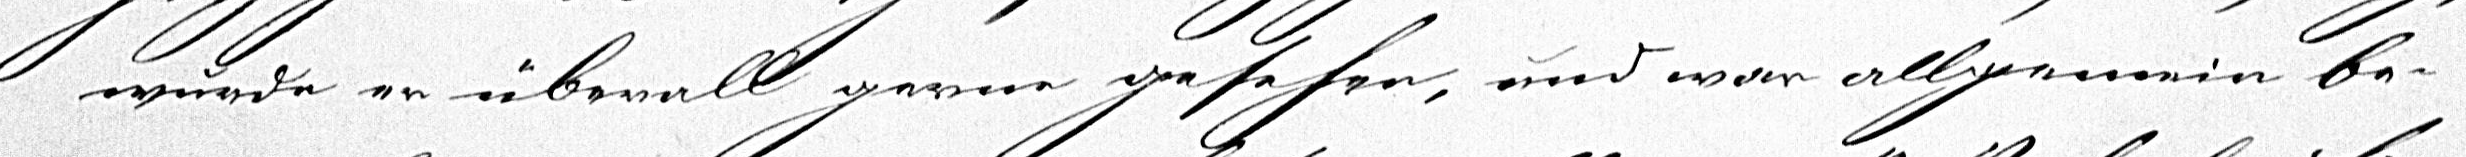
wurde er überall gerne gesehen, und war allgemein be¬
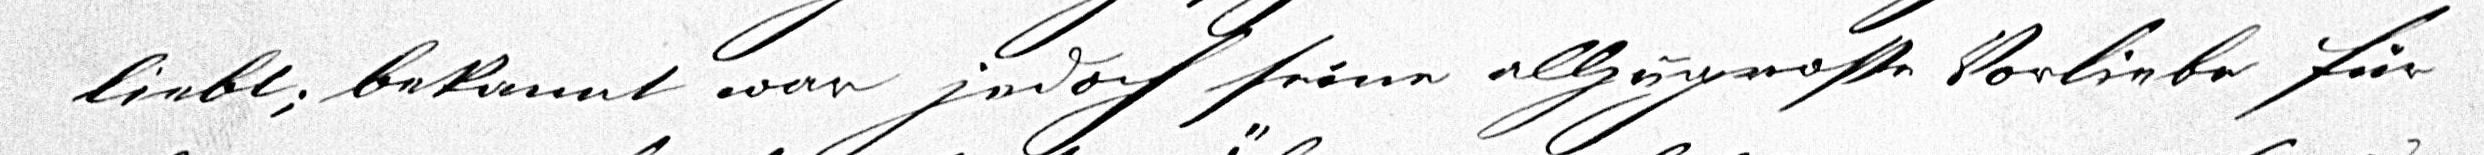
liebt; bekannt war jedoch seine allzugroße Vorliebe für
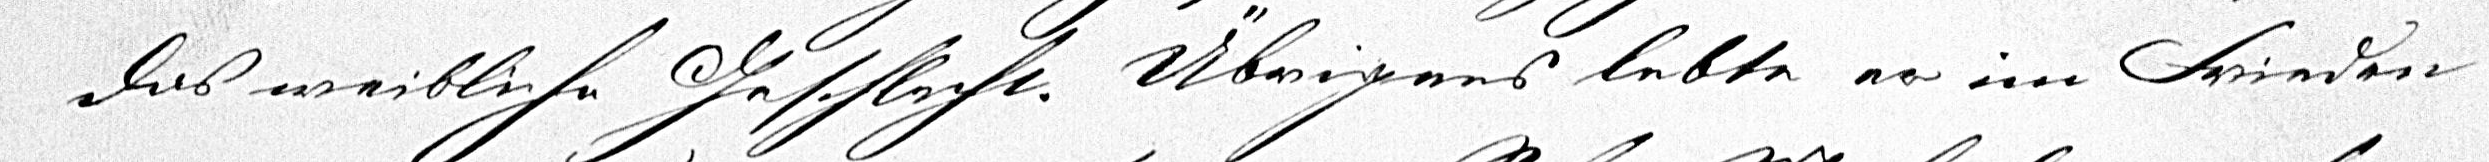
das weibliche Geschlecht. Übrigens lebte er im Frieden
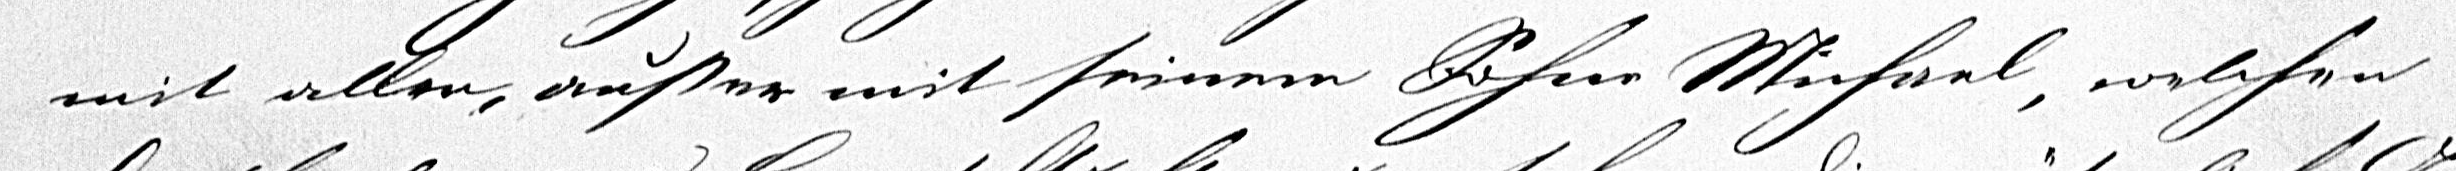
mit allen, außer mit seinem Sohne Michael, welchen
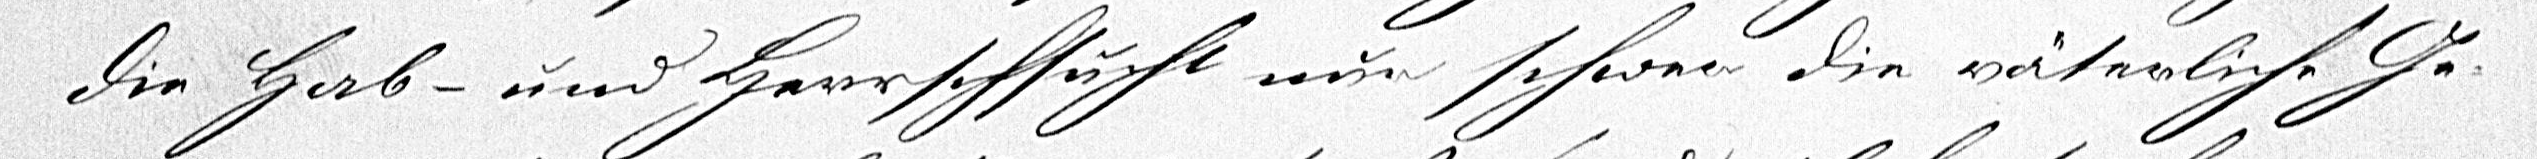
die Hab- und Herrschsucht um schwer die väterliche Ge¬
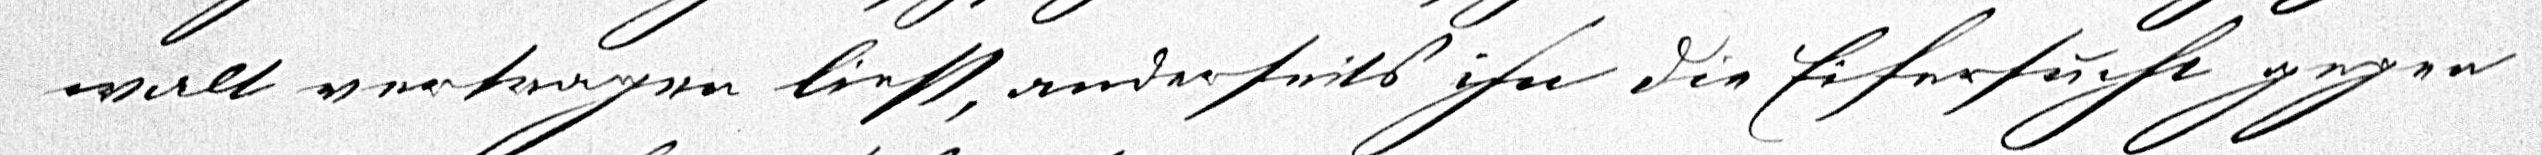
walt vertragen ließ, anderseits ihn die Eifersucht gegen
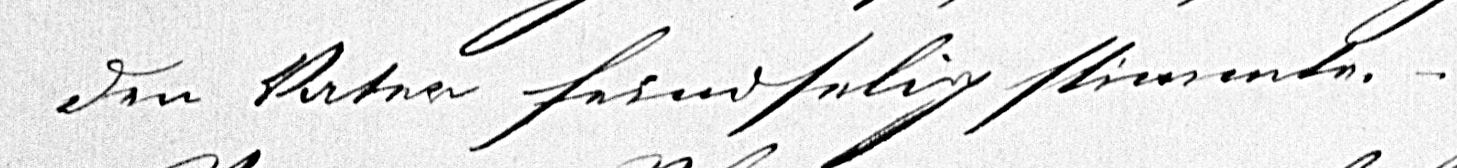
den Vater feindselig stimmte.-
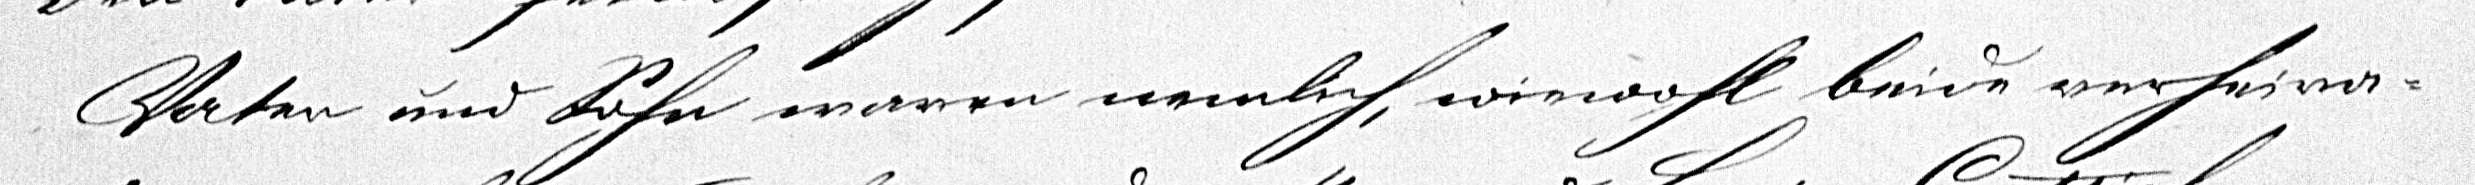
Vater und Sohn waren nemlich, wiewohl beide verheira¬
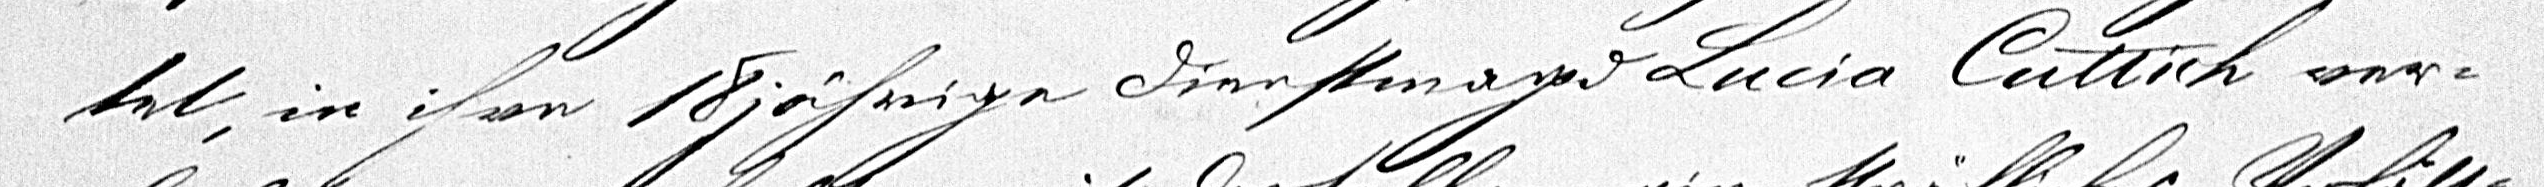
tet, in ihre 18jährige Dienstmagd Lucia Cuttich ver¬
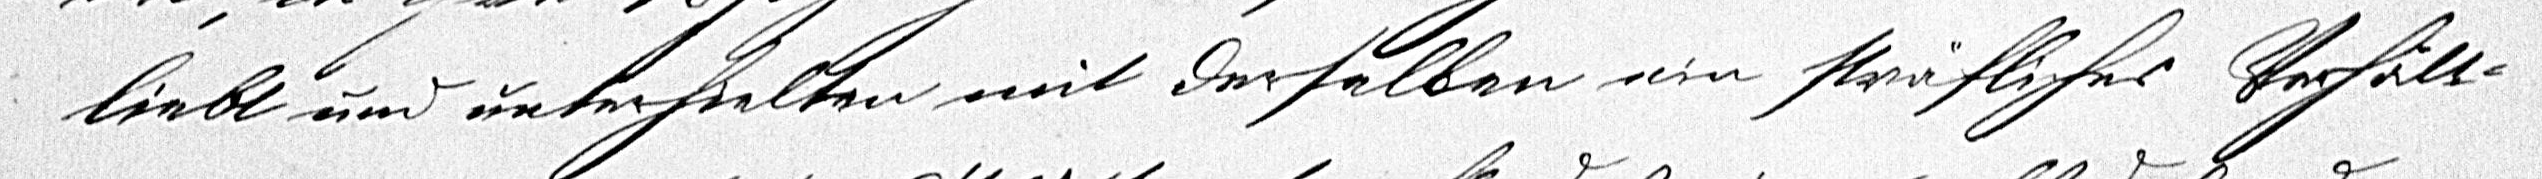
liebt und unterhielten mit derselben ein sträfliches Verhält¬
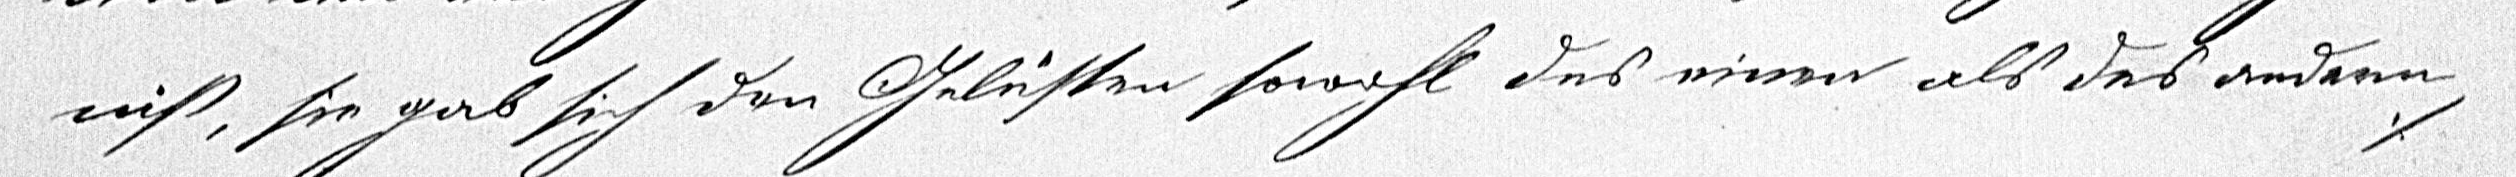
niß, sie gab sich den Gelüsten sowohl des einen als des andern
